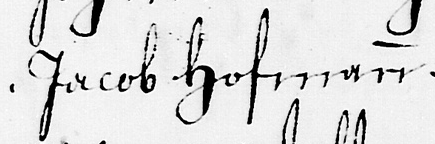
Jacob Hofmann.
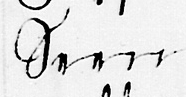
Seen
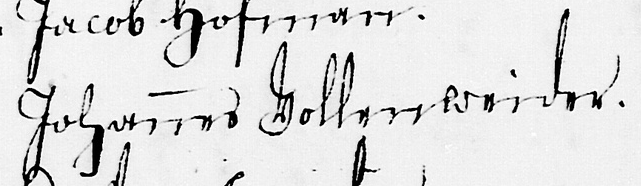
Johannes Vollenweider.
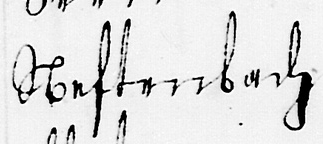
Neftenbach
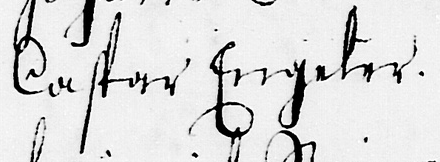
Caspar Engeler.
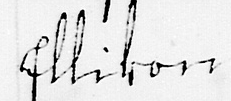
Ellikon
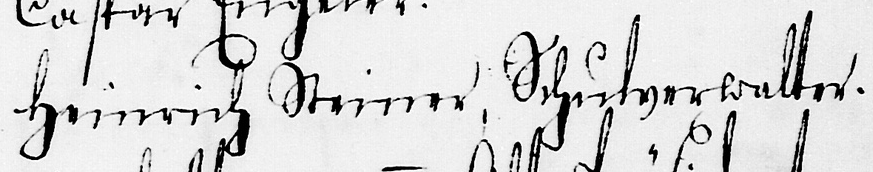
Heinrich Steiner, Schulverwalter.
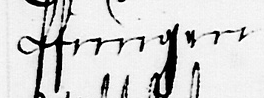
Pfungen
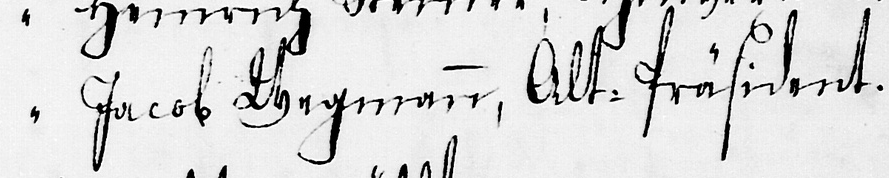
Jacob Wegmann, Alt-Präsident.
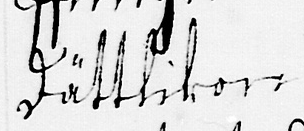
Dättlikon
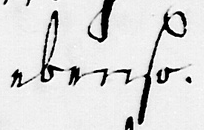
ebenso.
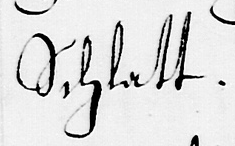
Schlatt
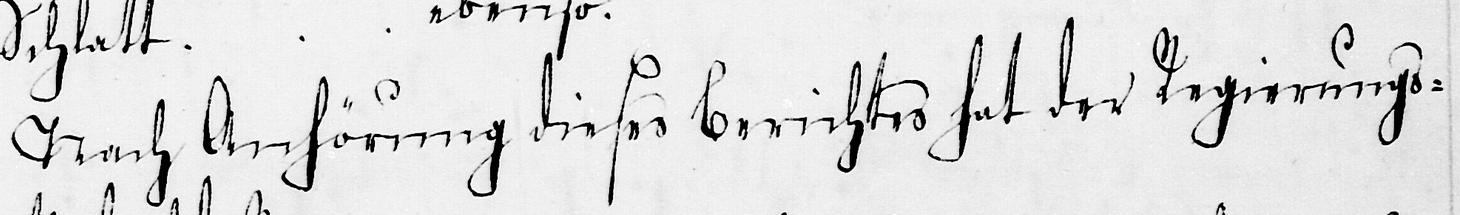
Nach Anhörung dieses Berichtes hat der Regierungs¬
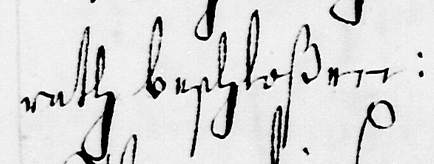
rath beschloßen:
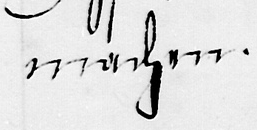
machen.
